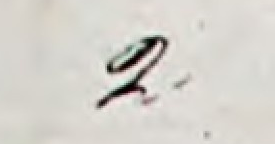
2
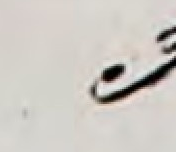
3
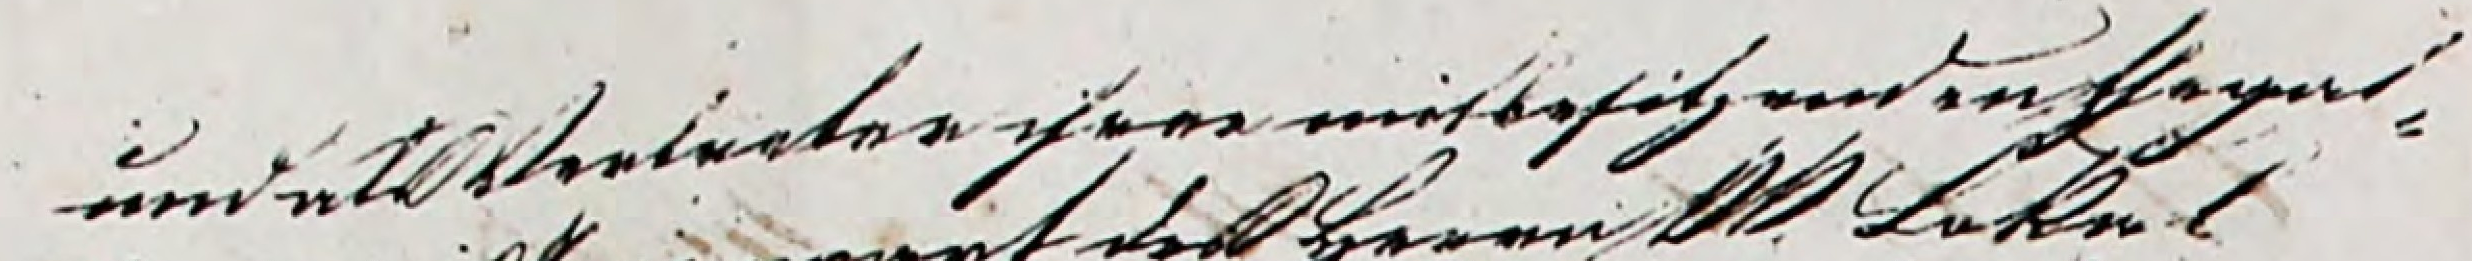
und als Vertreter ihrer mitbesitzenden Ehegat=
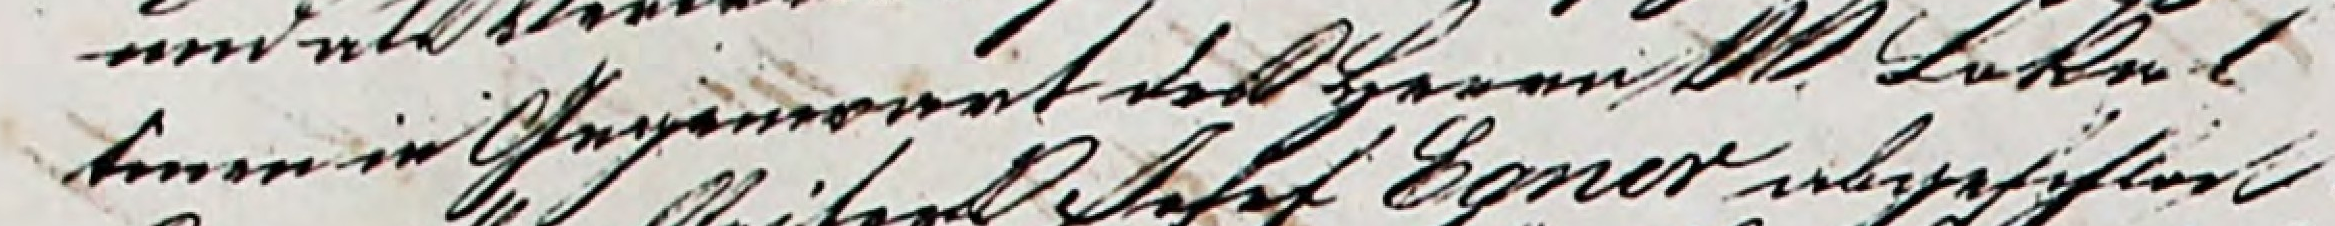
tinen in Gegenwant des Herrn kk. Lokal
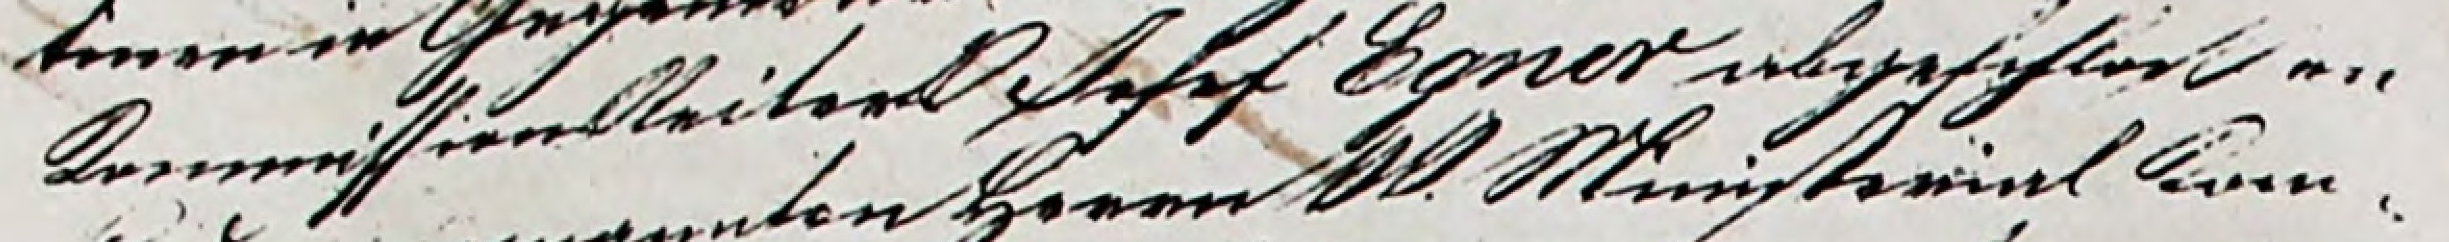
Kommissionsleiters Josef Egner abgeschlossen
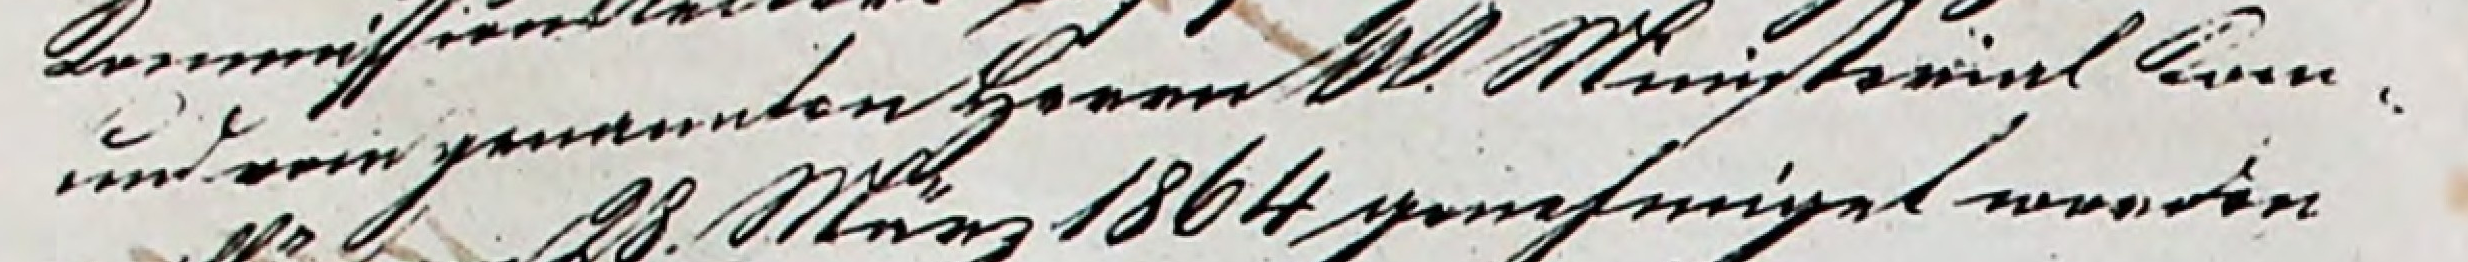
und vom genannten Herrn kk. Ministerial Kom„
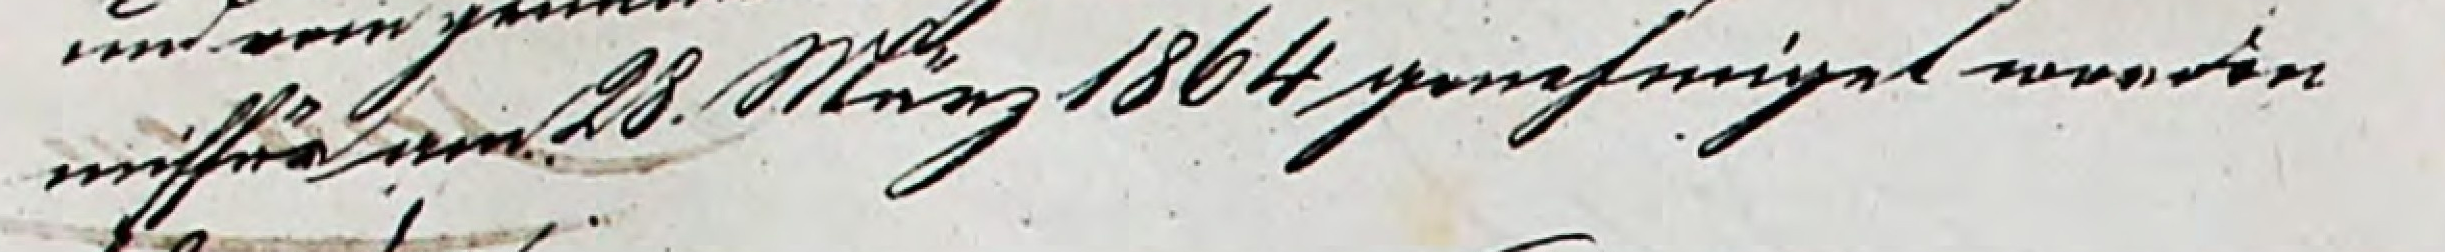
missär am 28. März 1864 genehmiget werden
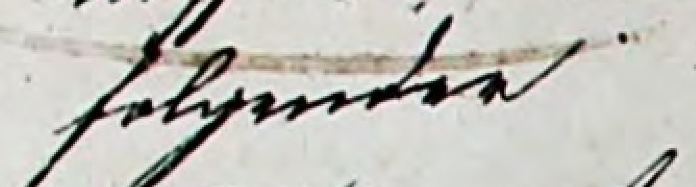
folgender
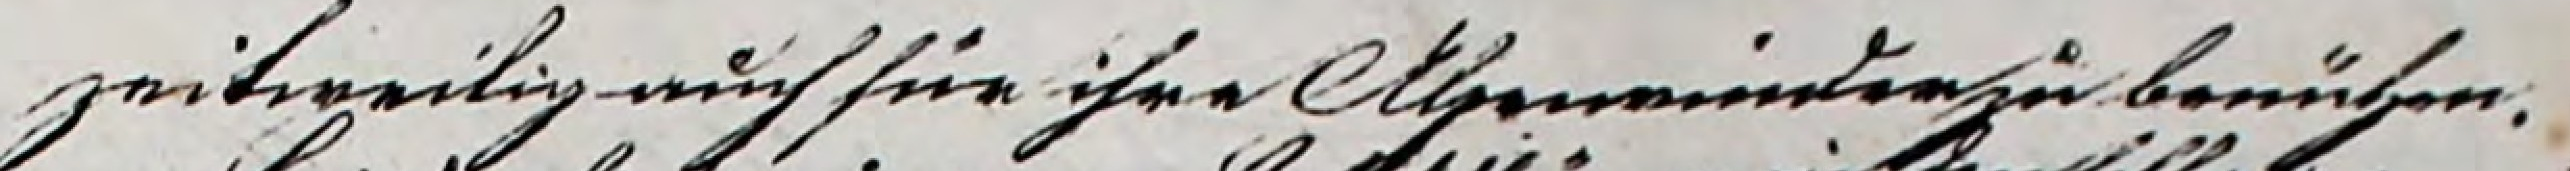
zeitweilig auch für ihre Algenrinder zu benützen.
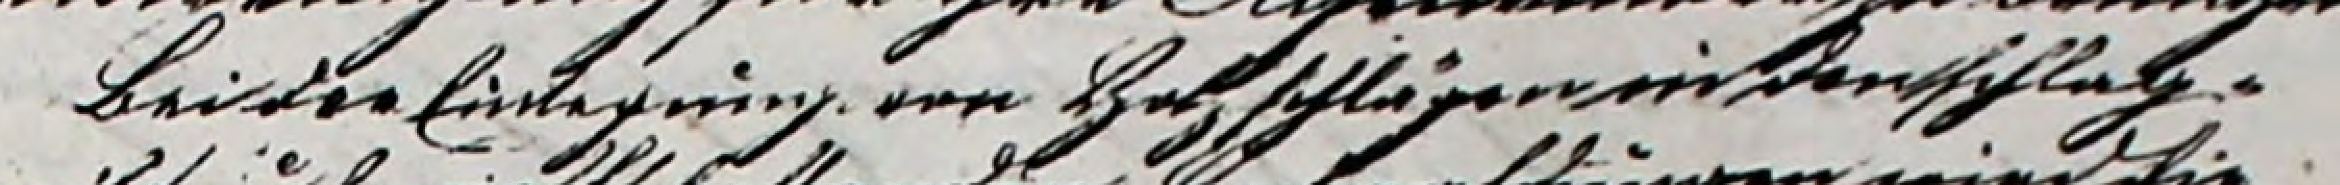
Bei der Einlegung von Holzschlägen in den schlag„
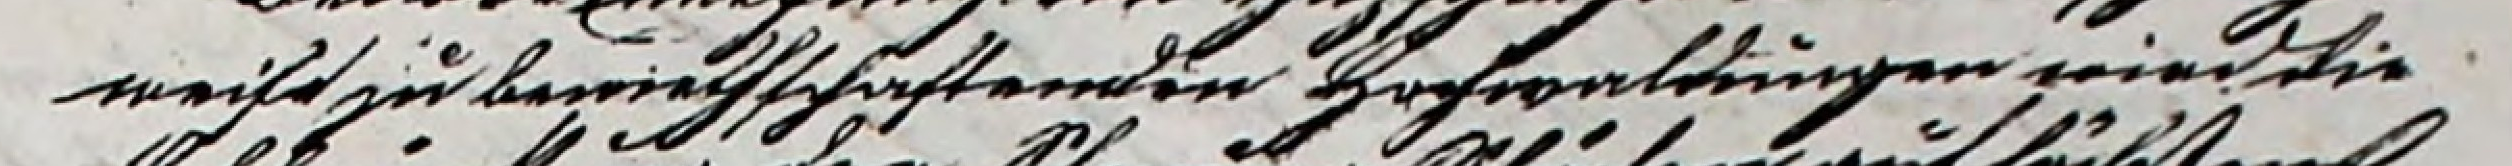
weise zu bewirthschaftenden Hochwaldungen wird die
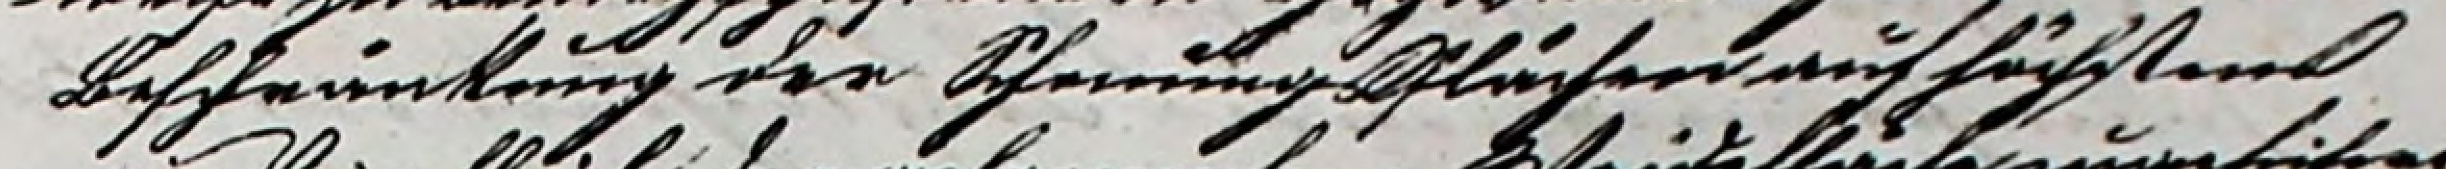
Beschränkung der Schonungsflächen auf höchstens
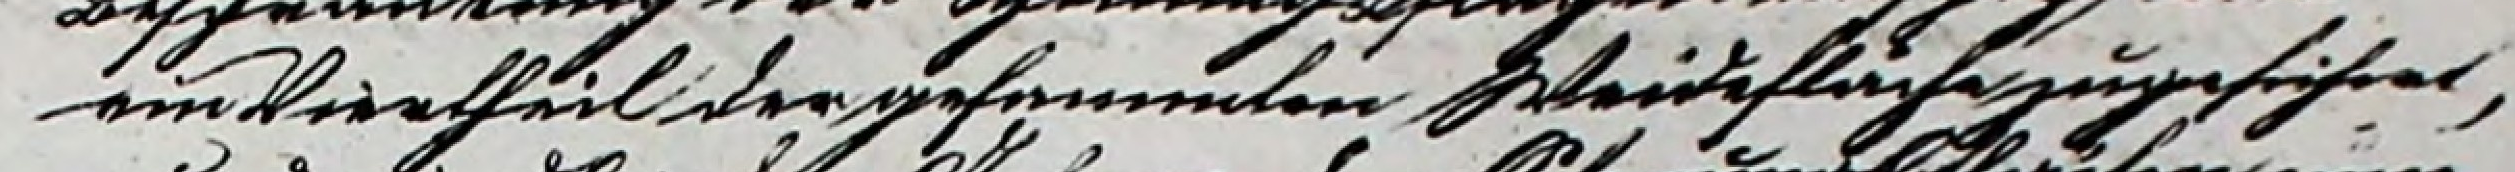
ein Viertheil gesammten Weidefläche zugesichert,
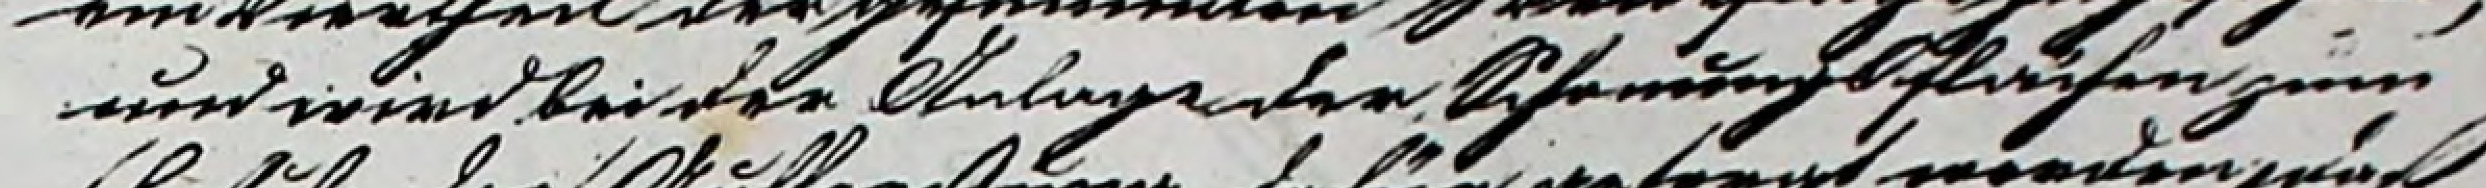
und wird bei der Anlage der Schonungsflächen zum
